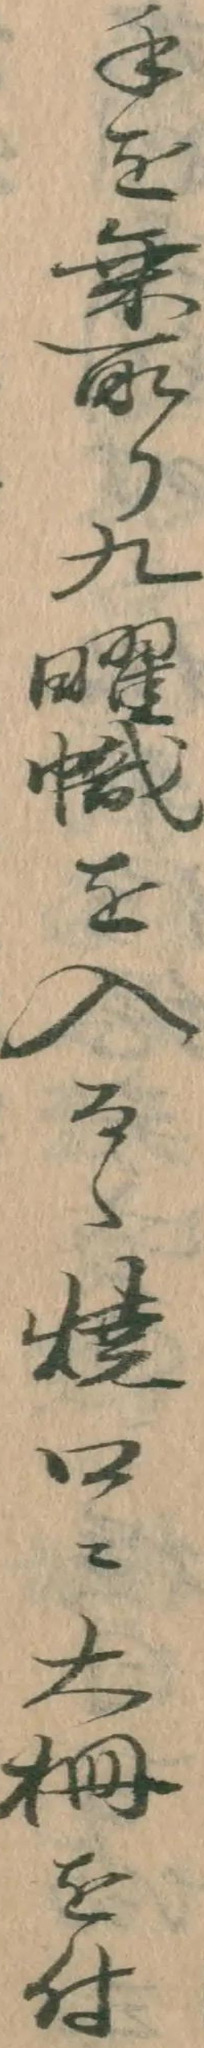手を乗取り九曜幟を入るゝ焼口に大柵を付
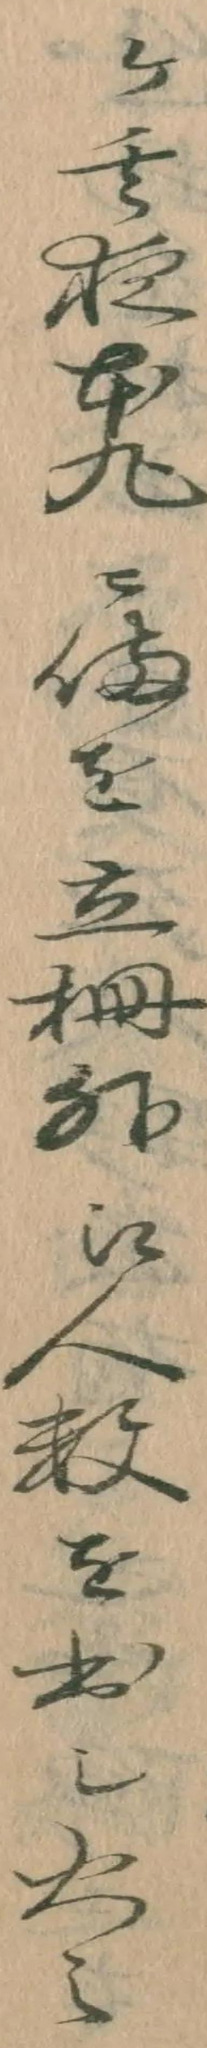け其夜本丸に備を立柵外江人数を出し火之
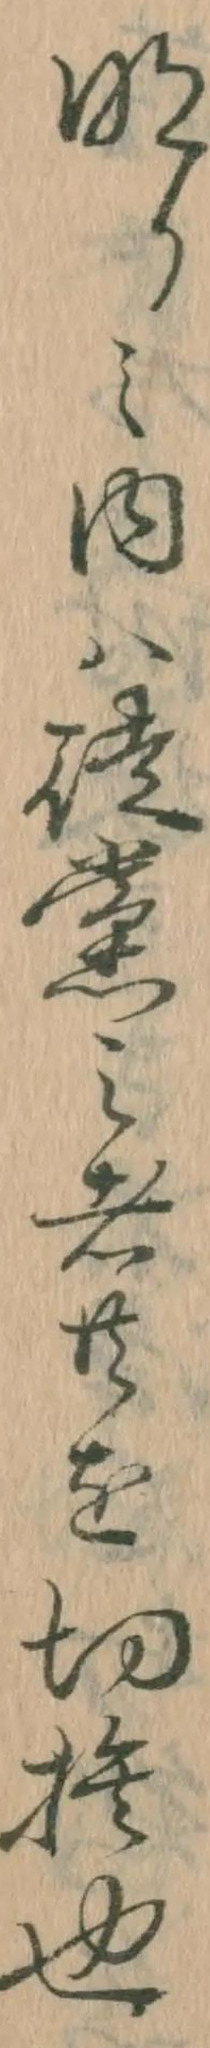明り之内は徒党之者共を切捨也
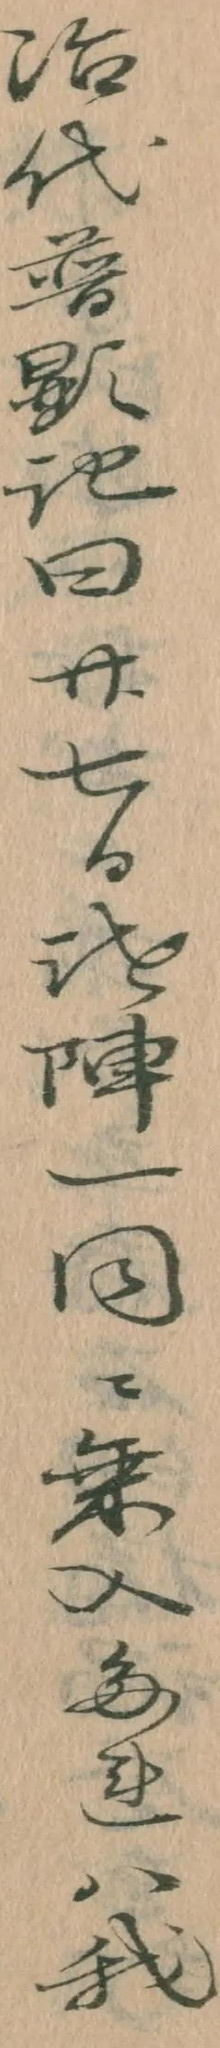治代普顕記曰廿七日諸軍一同に乗入多連は我
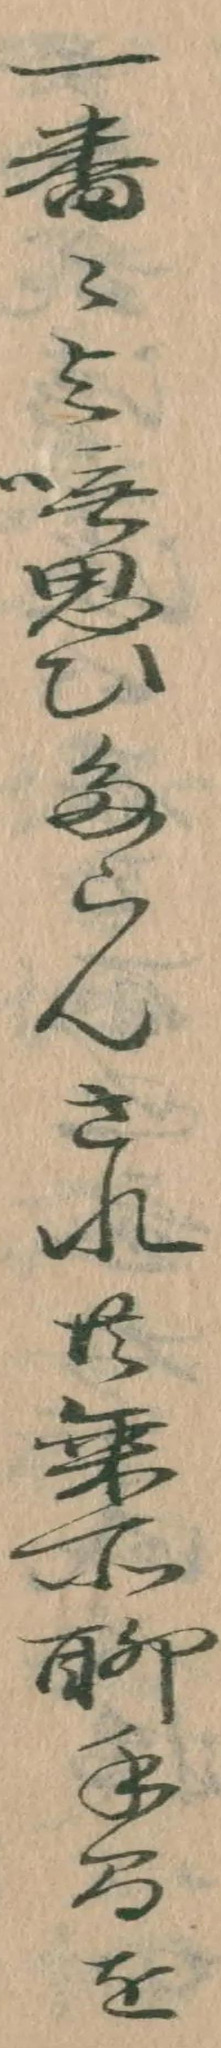一番に与嘸思ひ多らんされ共乗所聊手間を
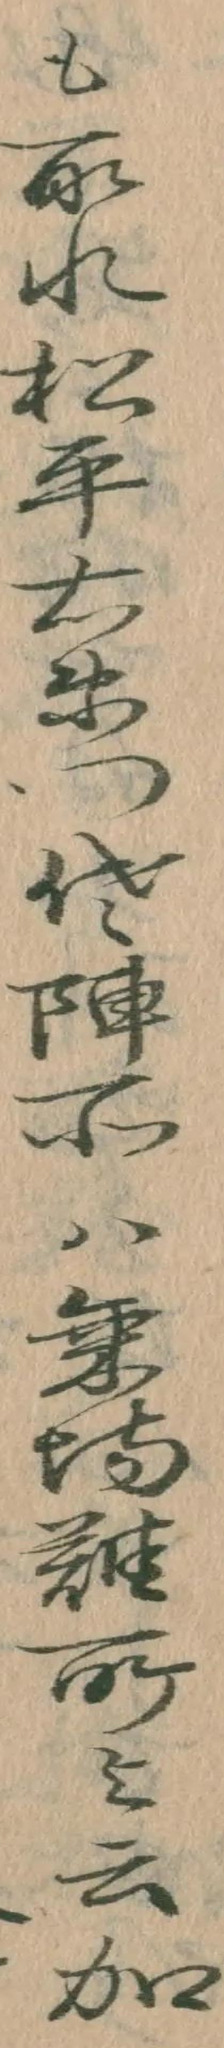も取れ松平右衛門佐陣所は乗場難所与云加
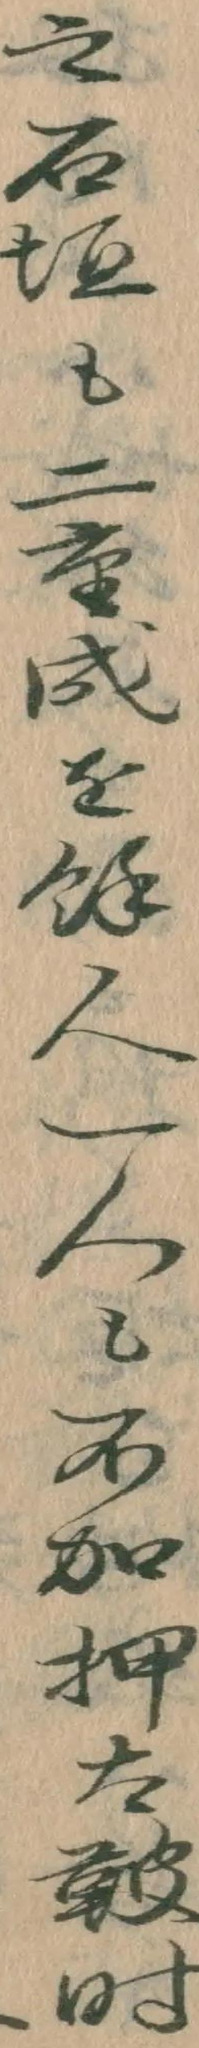之石垣も廿重成を余人一人も不加押太皷時
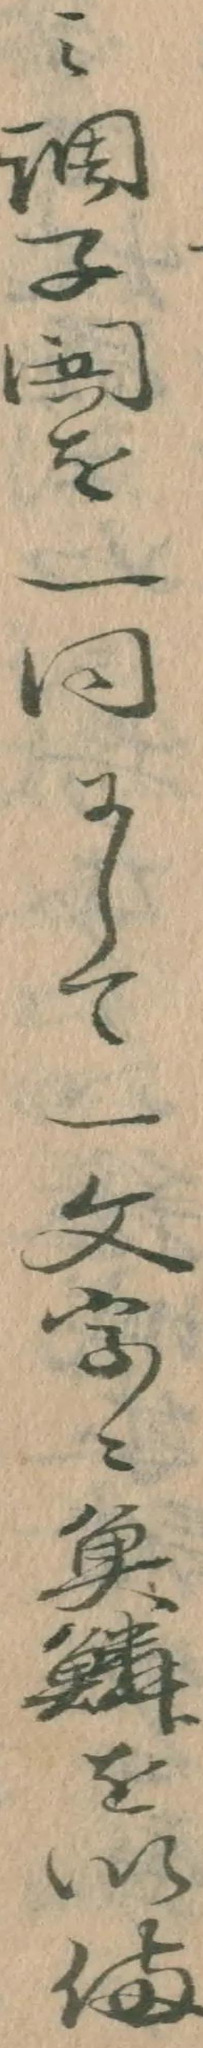之調子鬨を一同尓して一文字に魚鱗を以備
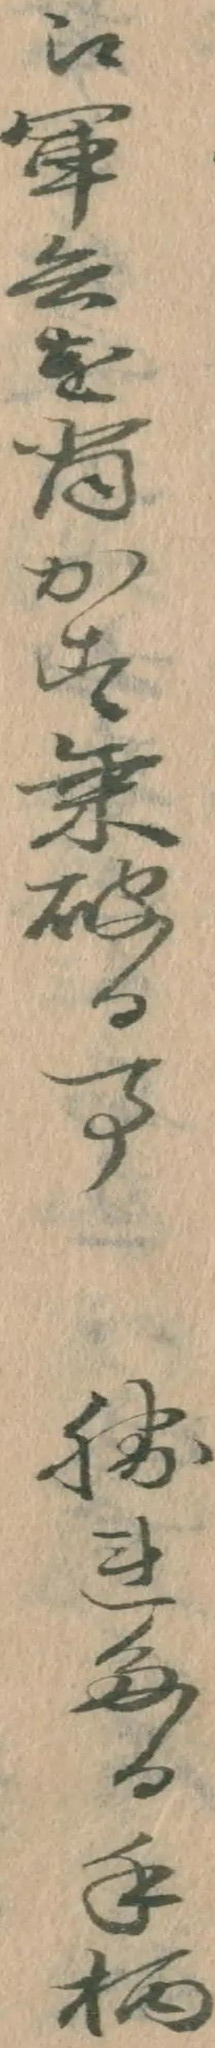江軍兵を背か春乗破る事勝連多る手柄
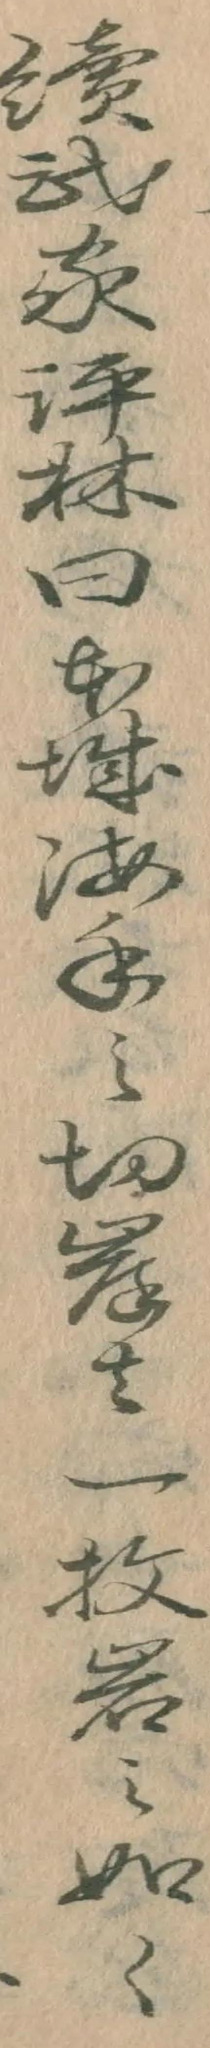続武家評林曰本城海手之切岸者一枚岩之如く
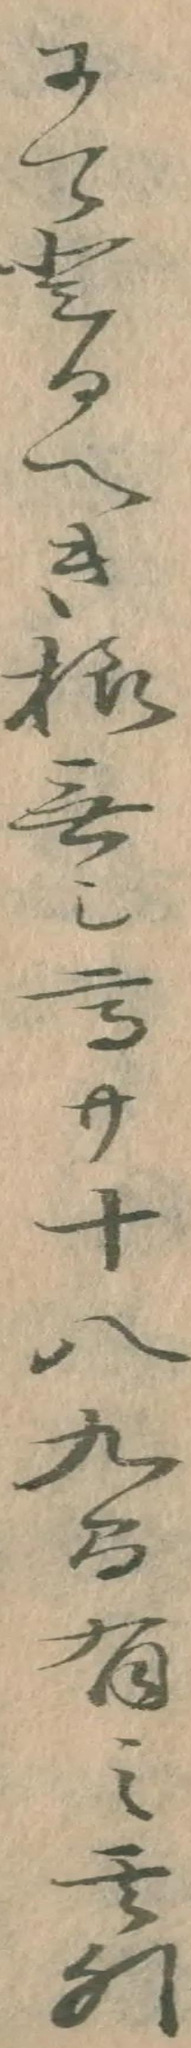尓て登るへき様無し高さ十八九間有之其外
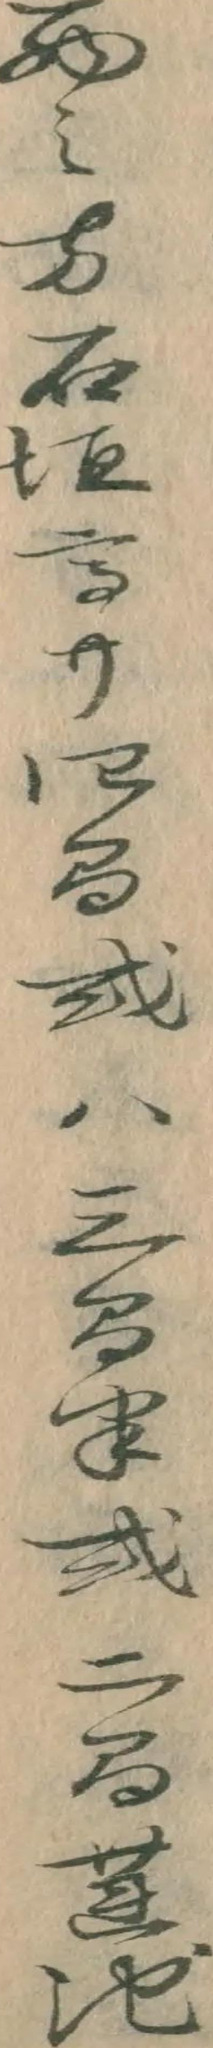西之方石垣高さ四間或は三間半或二間蓮池

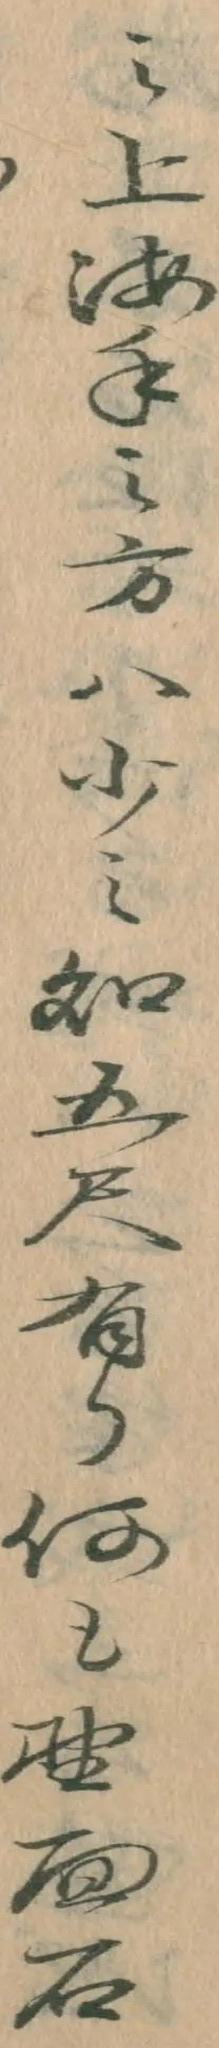之上海手之方は少し処五尺有り何も野面石
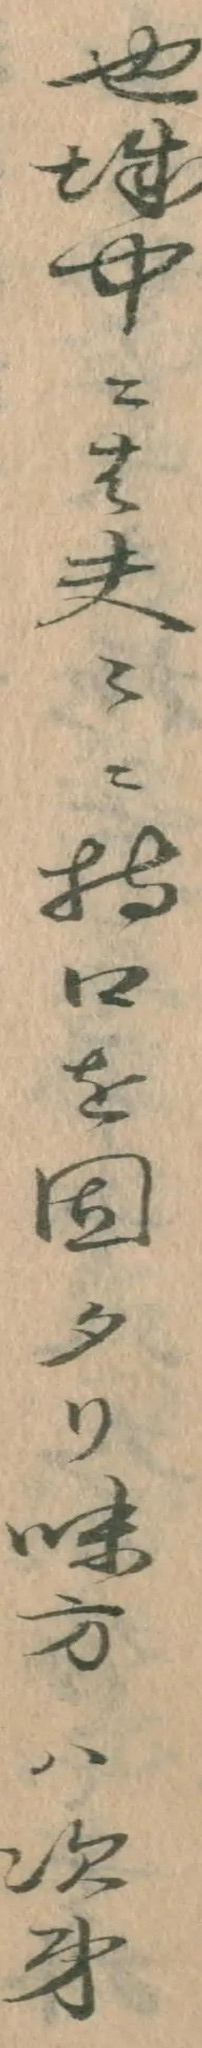也城中に者夫々に持口を固たり味方は次第
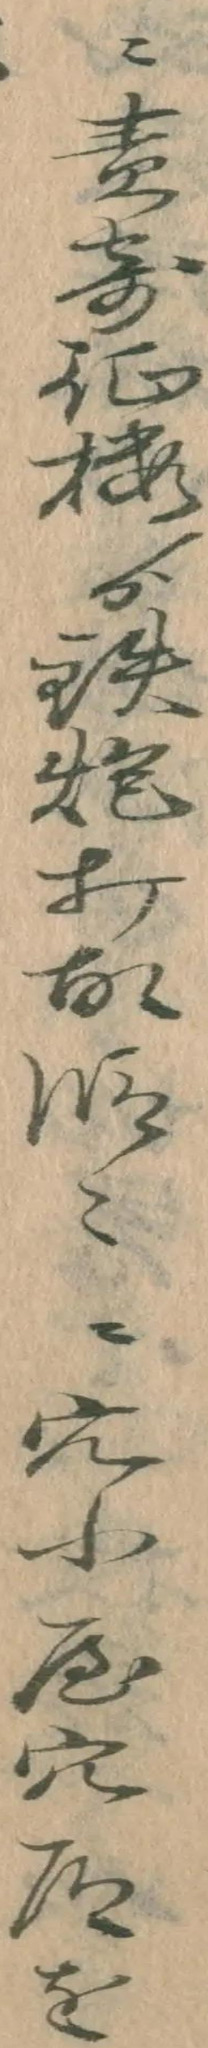に責寄征樓ゟ鉄炮打故段々に穴小屋穴道を
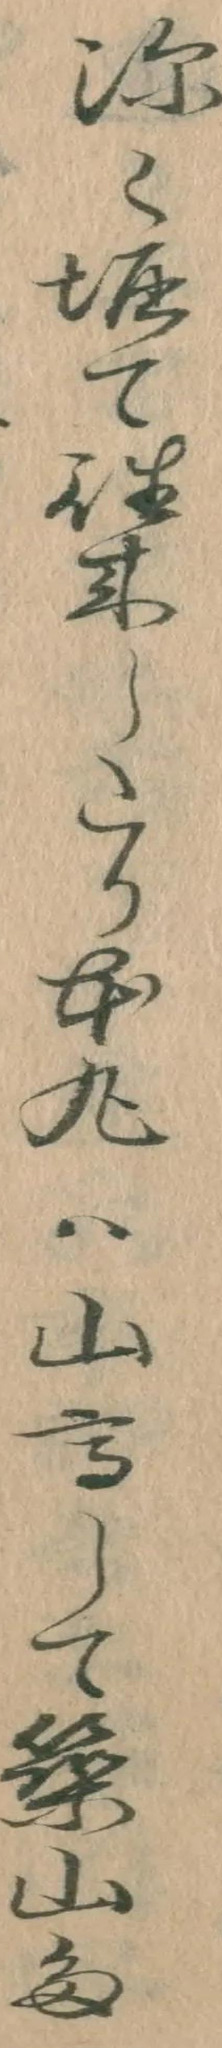深く掘て往来したり本丸は山高して築山多
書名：切支丹御退治記 49巻. [7]
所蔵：国立国会図書館 National Diet Library, JAPAN
